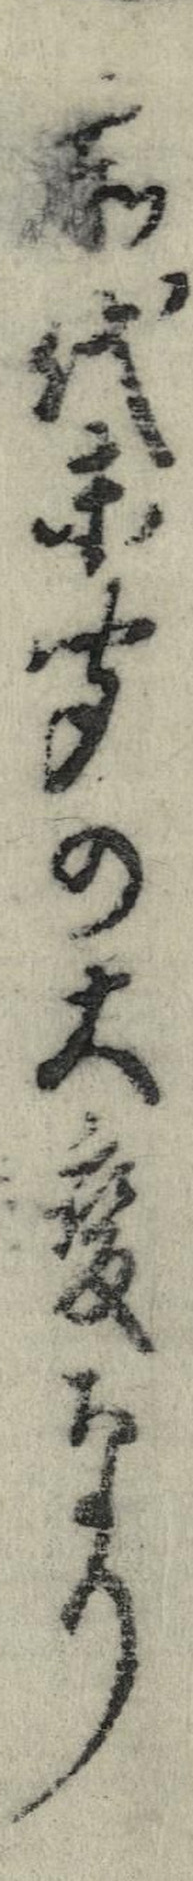前代未聞の大変なり
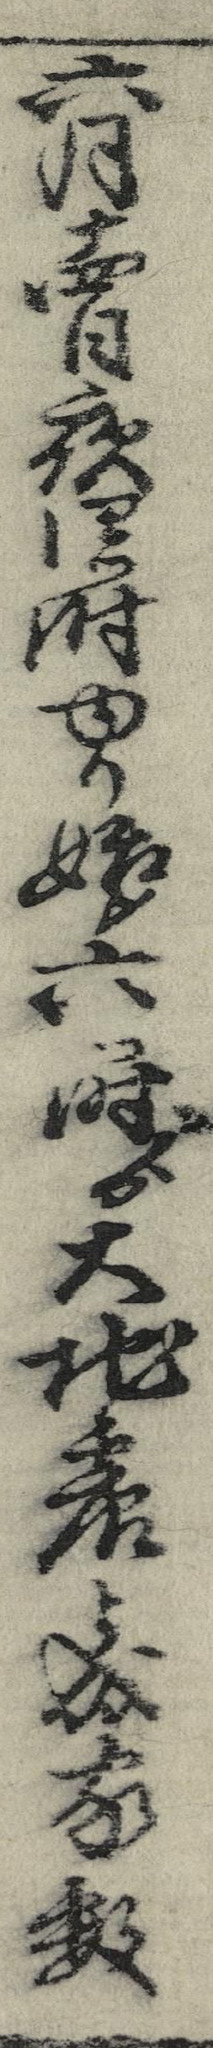六月十四日夜四ツ時ゆり始め六ツ時ゟ大地震に成家数
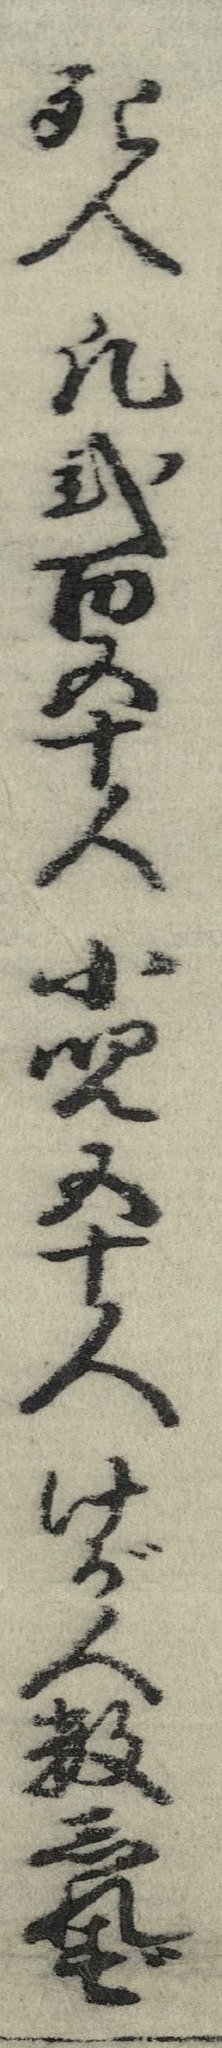死人凡弐百五十人小児五十人けが人数しれず
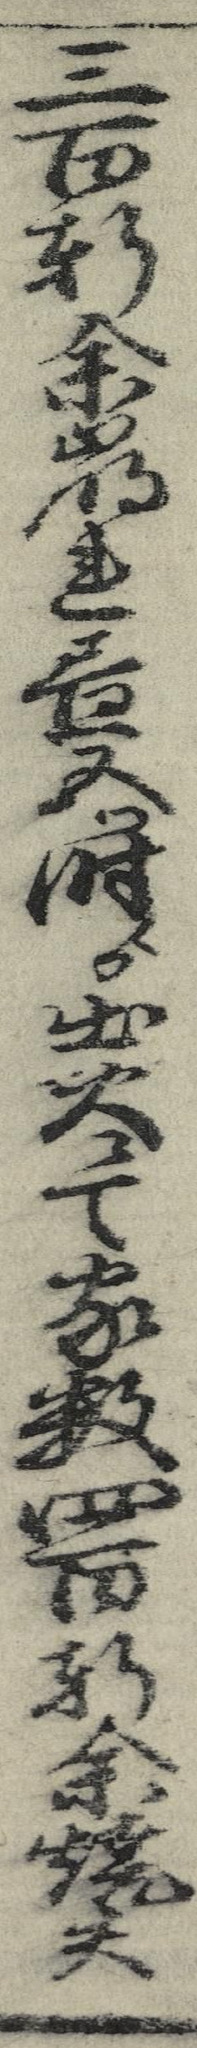三百軒余崩れ昼五ツ時ゟ出火にて家数四百軒余焼失
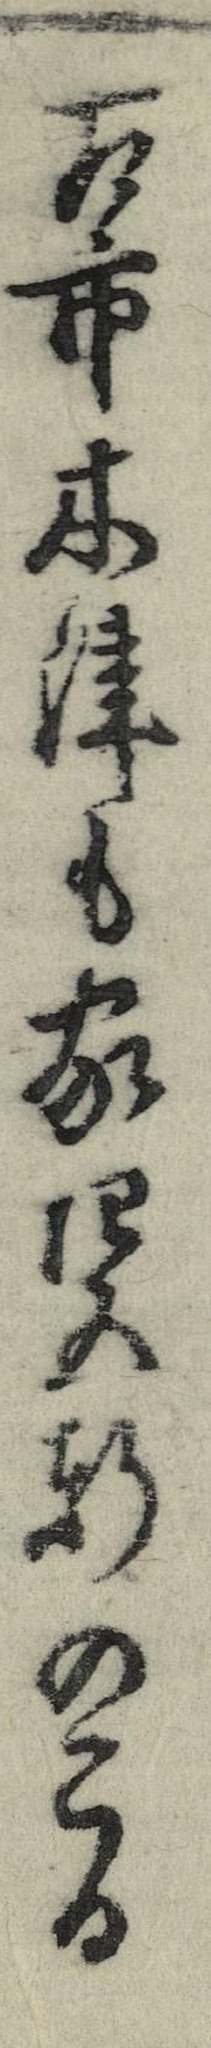古市木津も家四五軒のこる
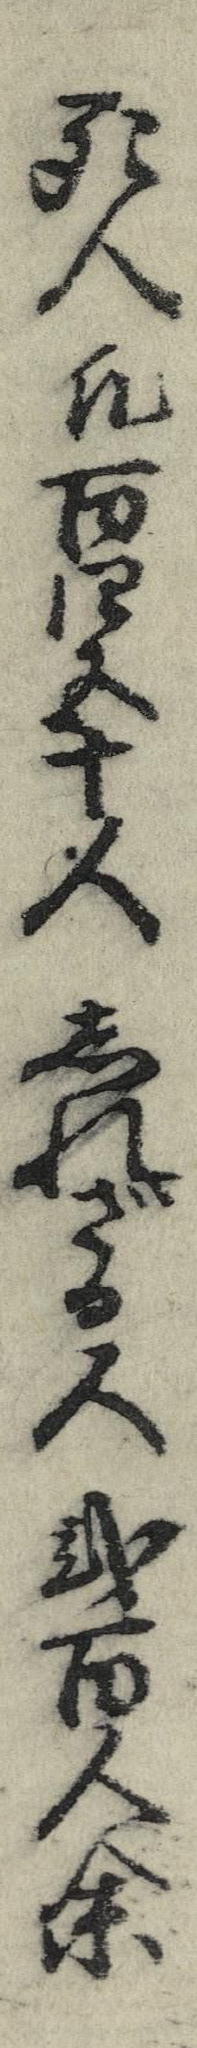死人凡百四五十人しれざる人弐百人余
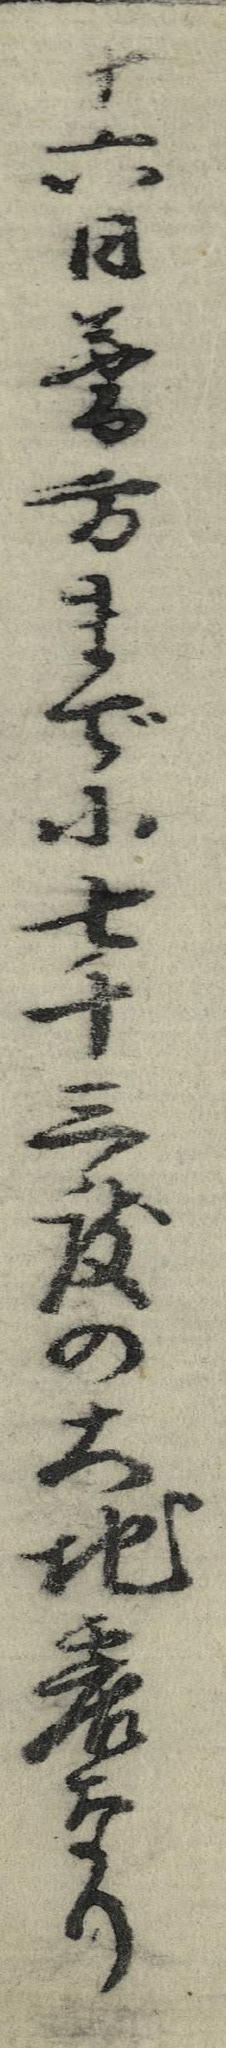十六日暮方までに七十三度の大地震なり
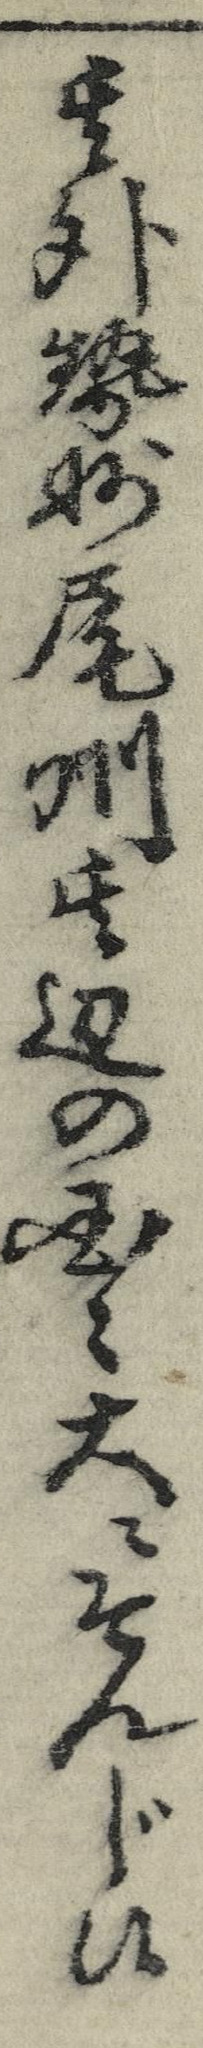其外勢州尾州其辺の国々大にそんじ候
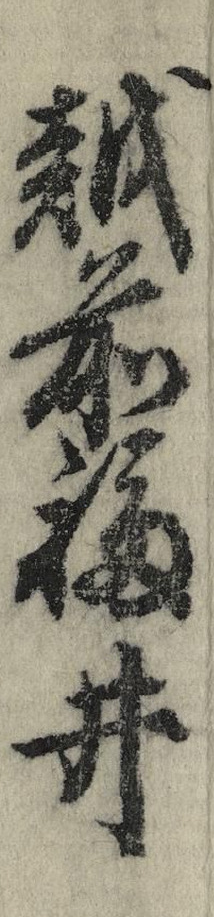越前福井
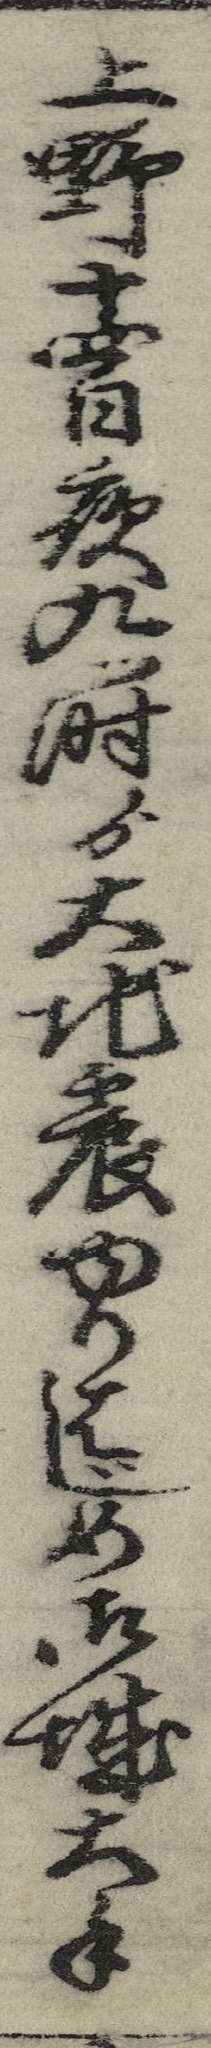上野十四日夜九ツ時ゟ大地震ゆりはじめ御堀大手
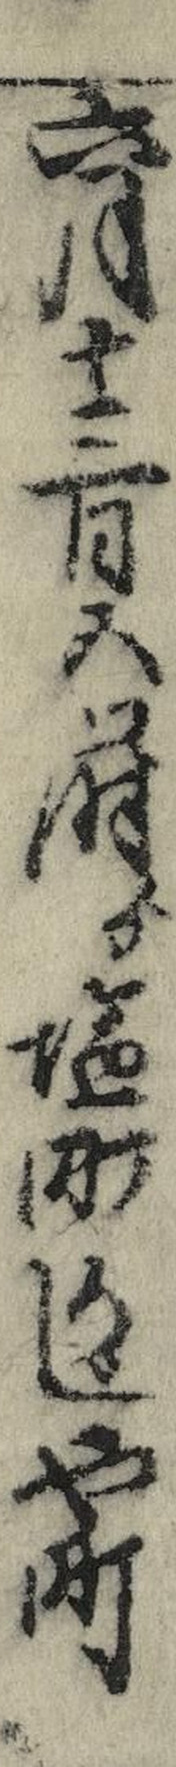六月十三日五ツ時ゟ塩町かじや町
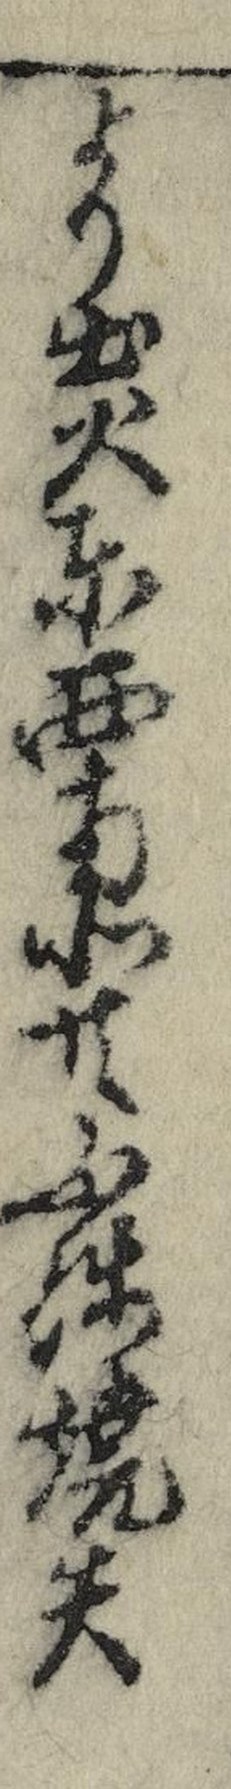より出火東西南北とも不残焼失
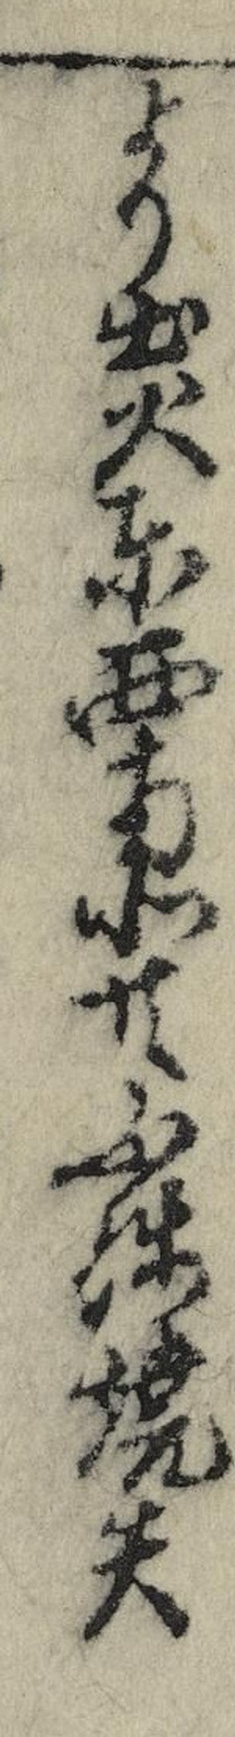より出火東西南北とも不残焼失
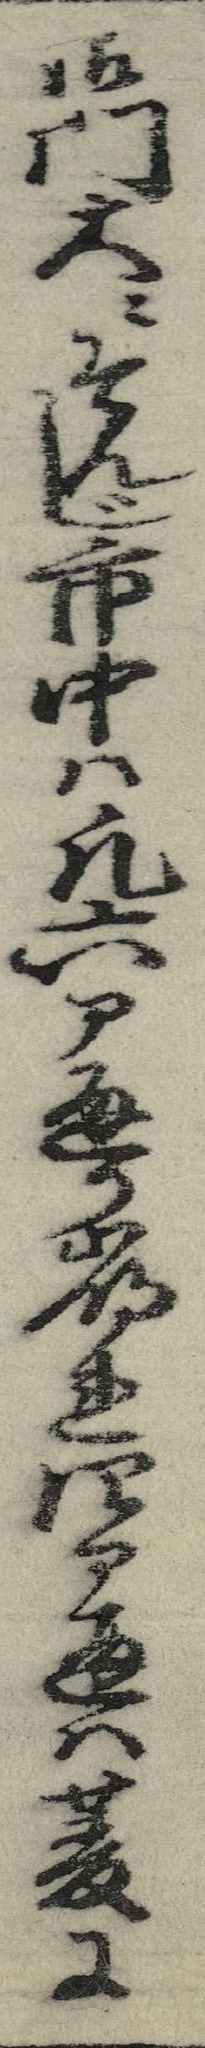御門大にそんじ市中は凡六部通り崩れ四部通は菱に
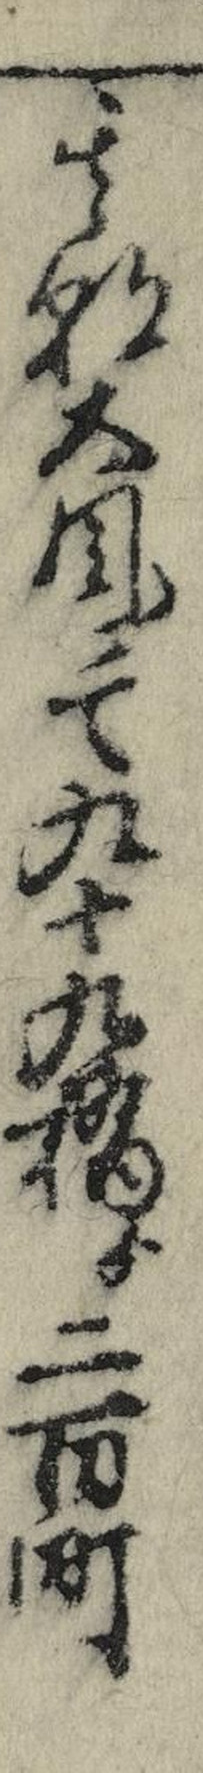其朝大風にて九十九橋ゟ二百町
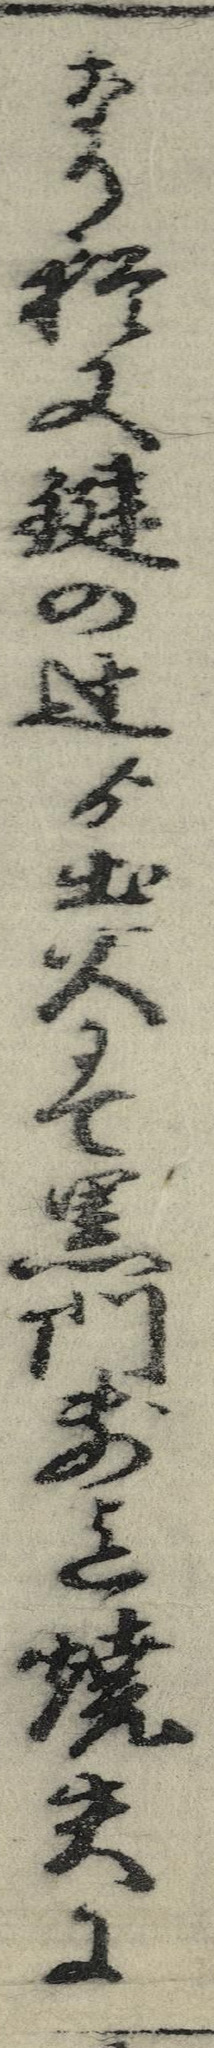なり猶又鍵の辻ゟ出火にて黒門敷迄焼失に
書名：聞書　諸國大地震并ニ出火
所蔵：東京大学地震研究所図書室 Earthquake Research Institute Library, The University of Tokyo, JAPAN
